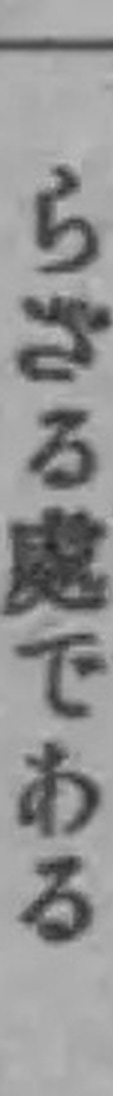らざる処である
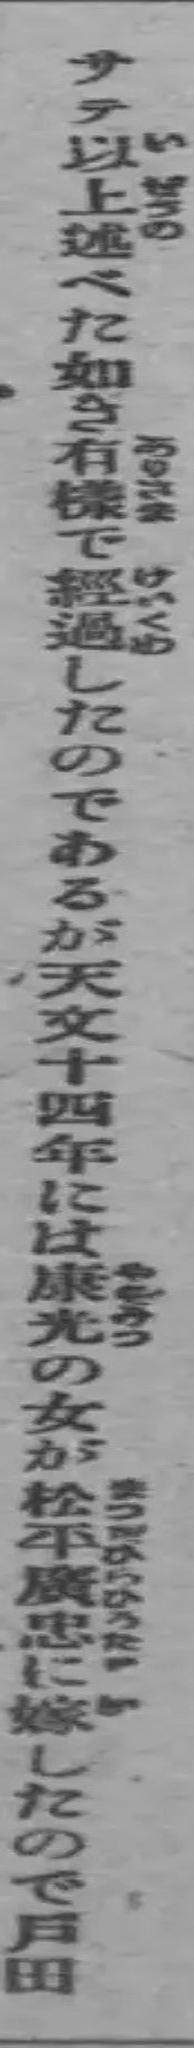康光の女婚嫁サテ以上述べた如き有様で経過したのであるが天文十年には康光の女が松平広忠に嫁したので戸田
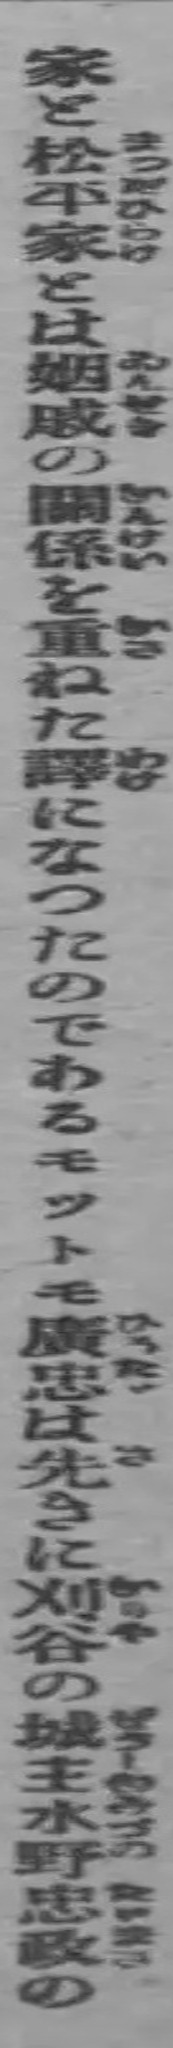家と松平家とは姻戚の関係を重ねた訳になつたのであるモツトモ広忠は先きに刈谷の城主水野忠政の
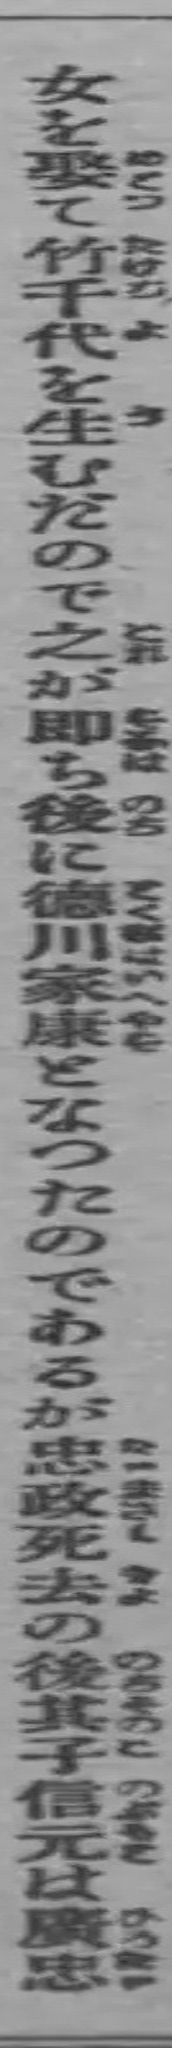女を娶て竹千代を生むだので之が即ち後に徳川家康となつたのであるが忠政死去の後其子信元は広忠
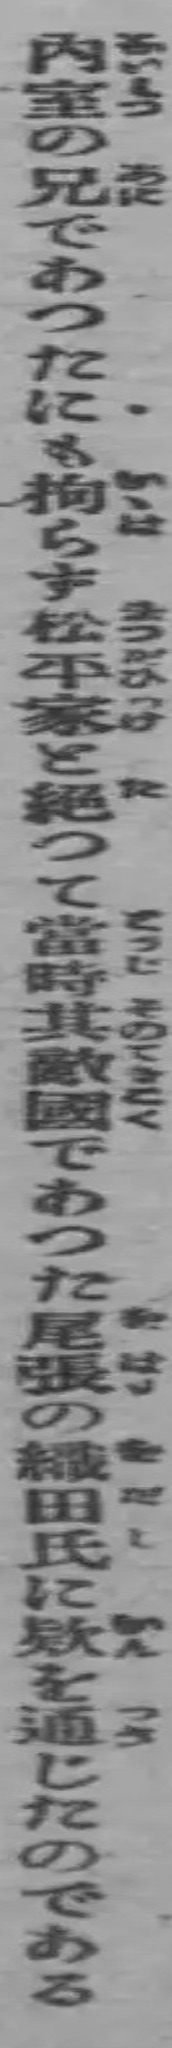内室の兄であつたにも拘らず松平家と絶つて当時其敵国であつた尾張の織田氏に欵を通じたのである
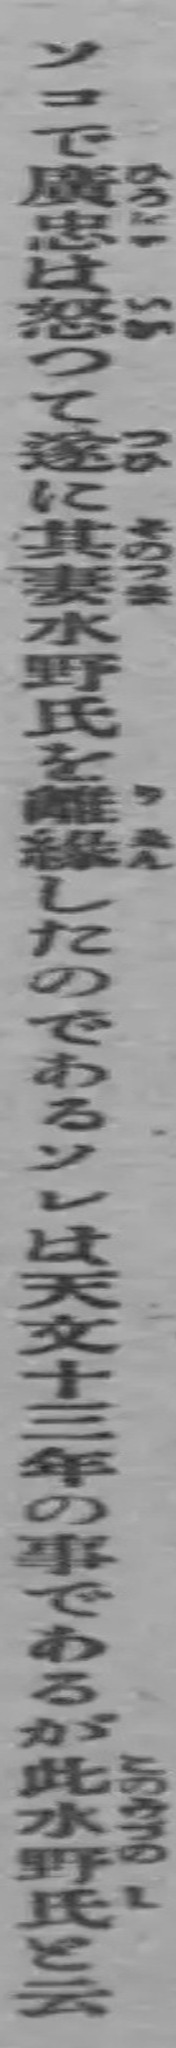ソコで広忠は怒つて遂に其妻水野氏を離縁したのであるソレは天文十三年の事であるが此水野氏と云
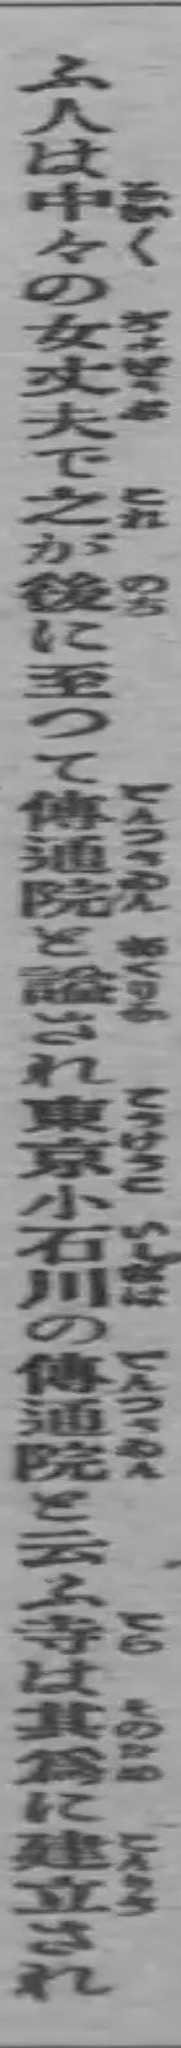ふ人は中々の女丈夫で之が後に至つて伝通院と諡され東京小石川の伝通院と云ふ寺は其為に建立され
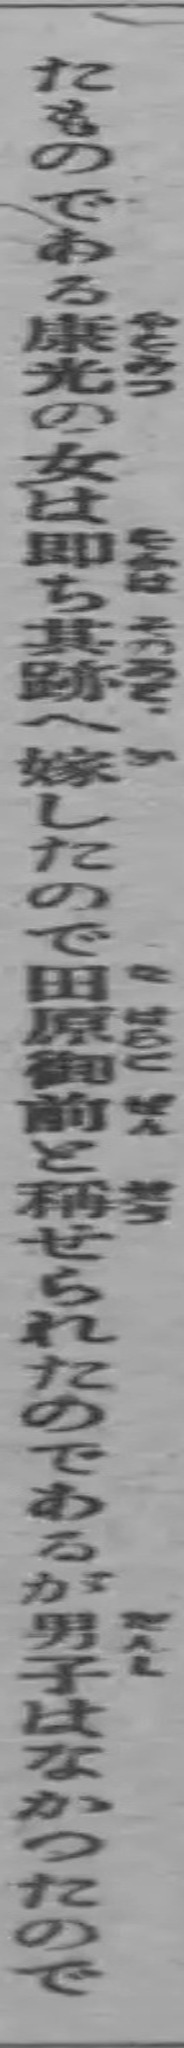たものである康光の女は即ち其跡へ嫁したので田原御前と称せられたのであるが男子はなかつたので
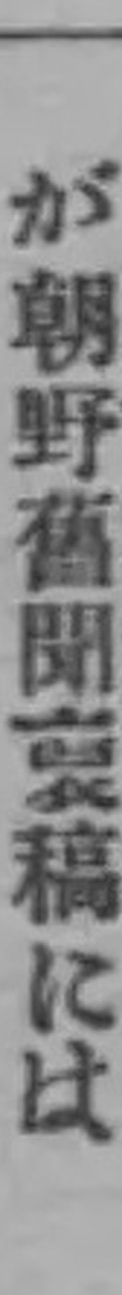が朝野旧聞裒稿には
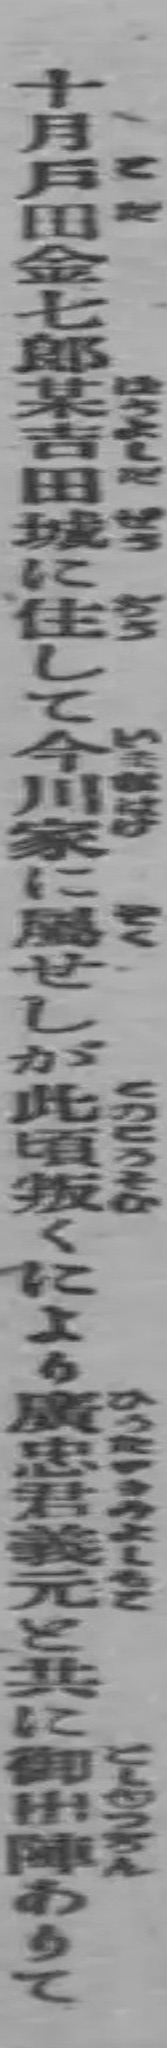十月戸田金七郎某吉田城に住して今川家に属せしが此頃叛くにより広忠君義元と共に御出陣ありて
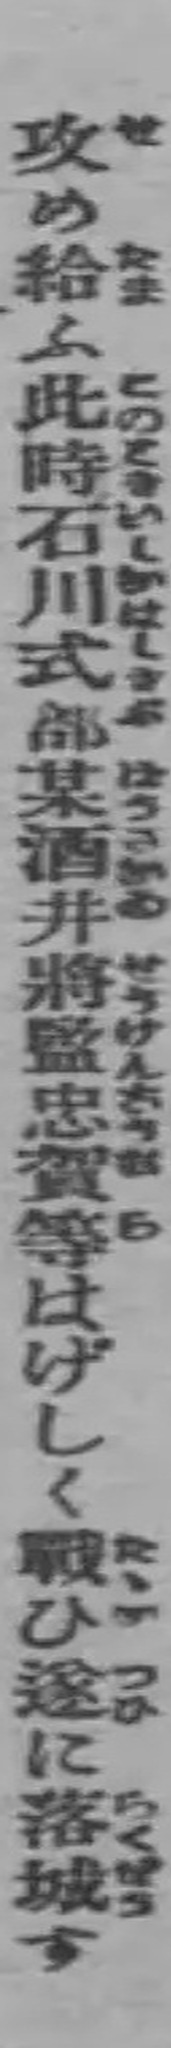攻め給ふ此時石川式部某酒井将監忠賀等はげしく戦ひ遂に落城す
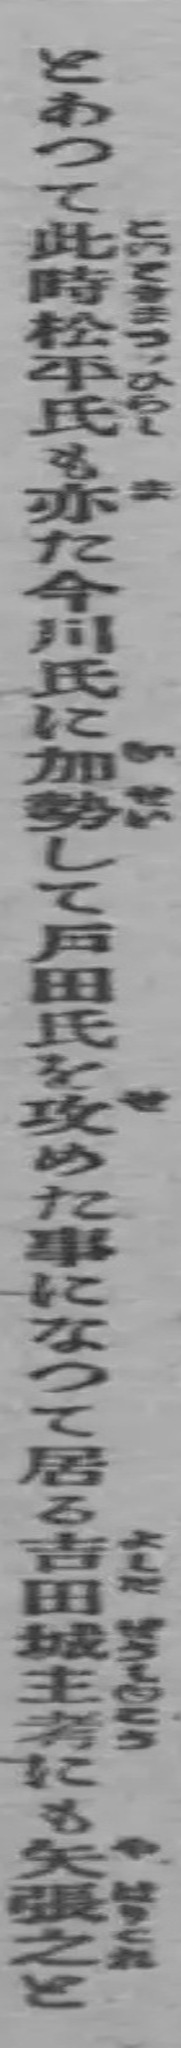とあつて此時松平氏も亦た今川氏に加勢して戸田氏を攻めた事になつて居る吉田城主考にも矢張之と
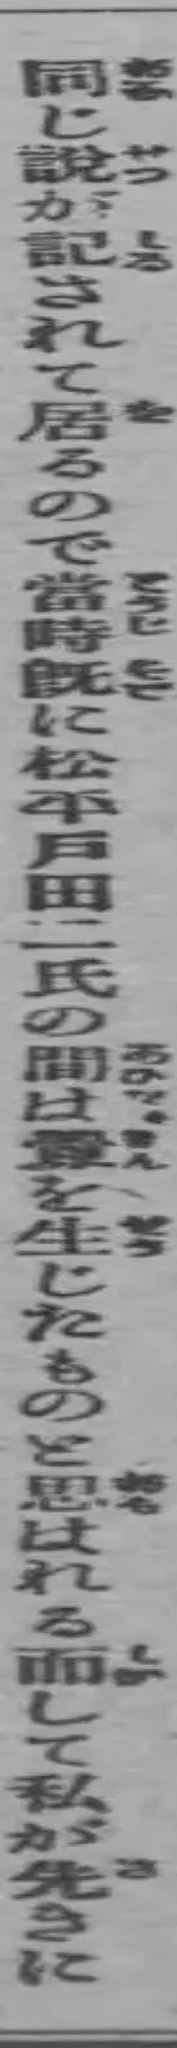同じ説が記されて居るので当時既に松平戸田二氏の間は釁を生じたものと思はれる而して私が先きに
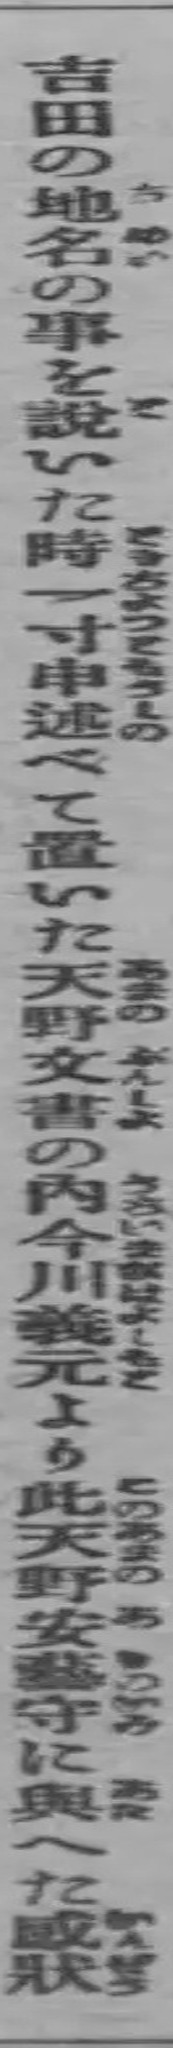吉田の地名の事を説いた時一寸申述べて置いた天野文書の内今川義元より此天野安芸守に与へた咸状
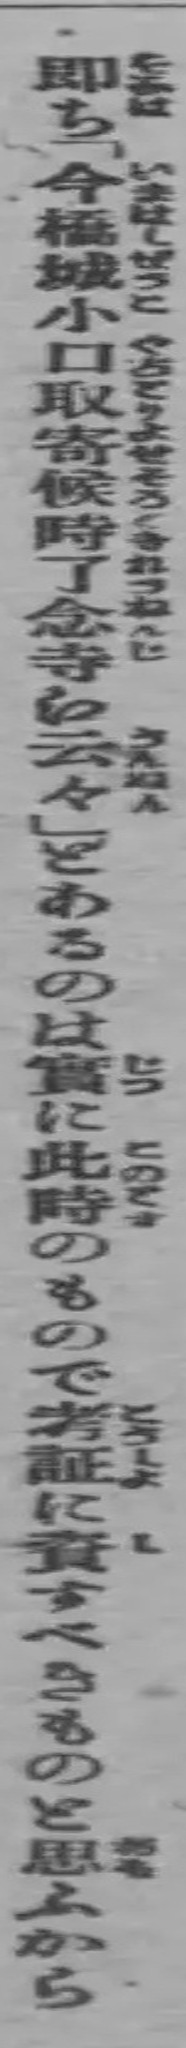即ち「今橋城小口取寄候時了念寺え云々」とあるのは実に此時のもので考証に資すべきものと思ふから
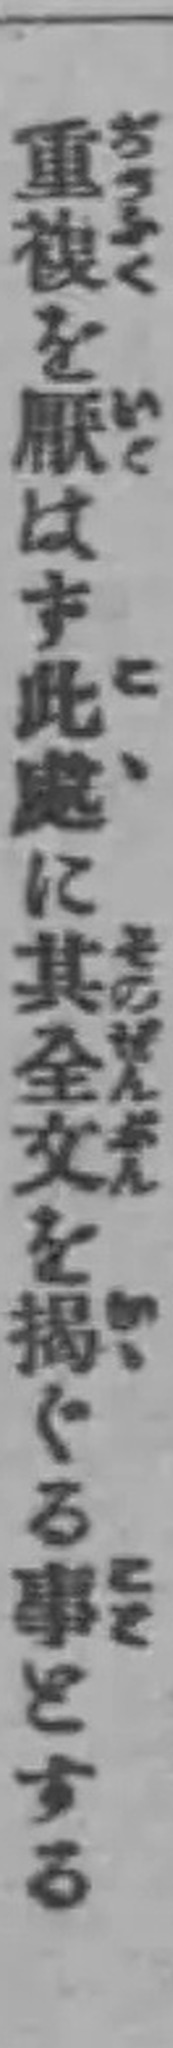重複を厭はず此処に其全文を掲ぐる事とする
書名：豊橋市史談
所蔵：国立国会図書館 National Diet Library, JAPAN
